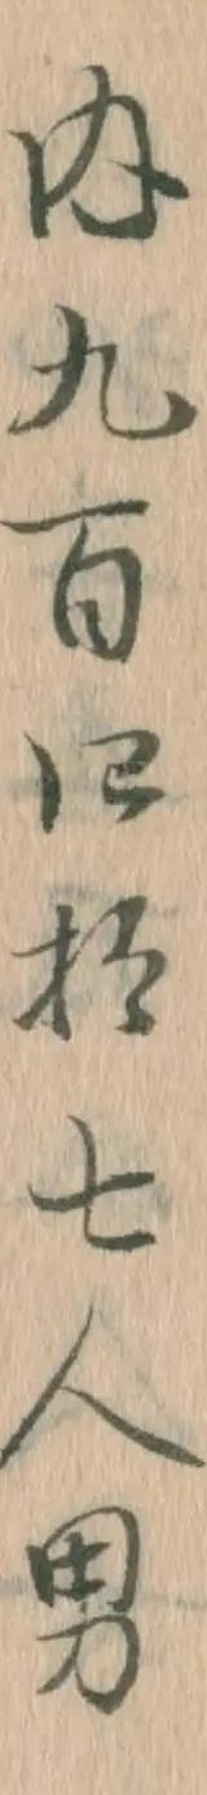内九百四拾七人男
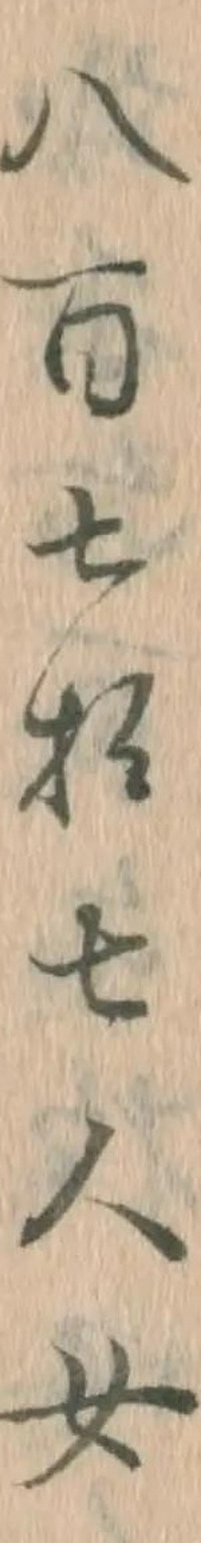八百七拾七人女
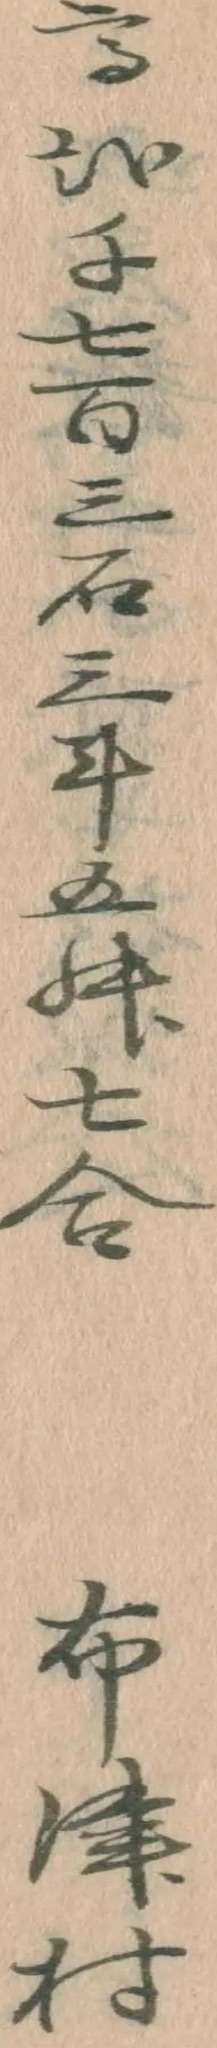高弐千七百三石三斗五升七合布津村
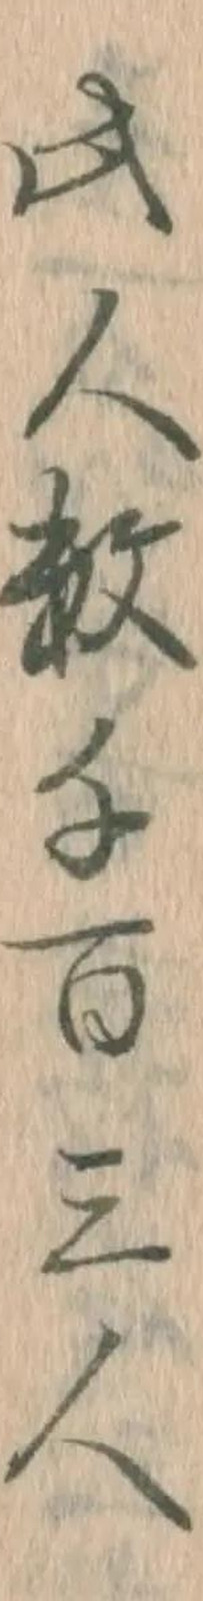此人数千百三人
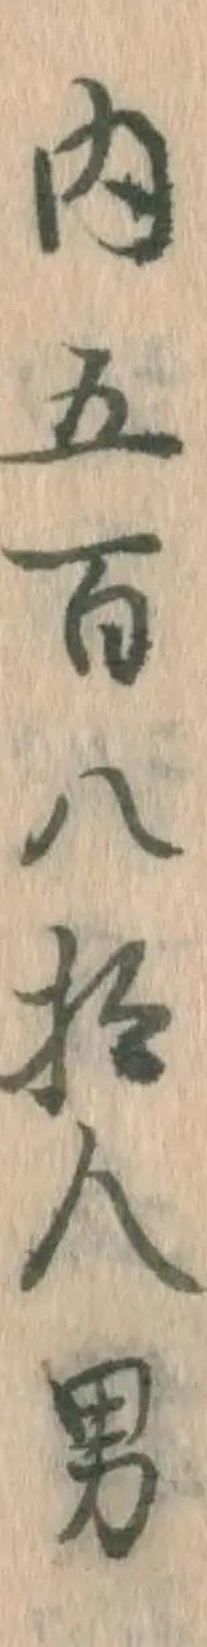内五百八拾人男
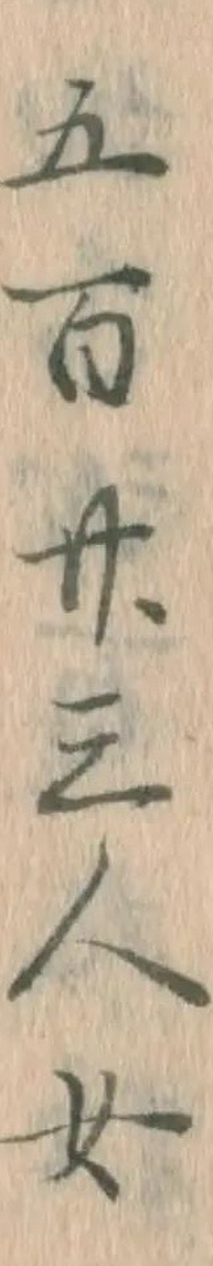五百廿三人女
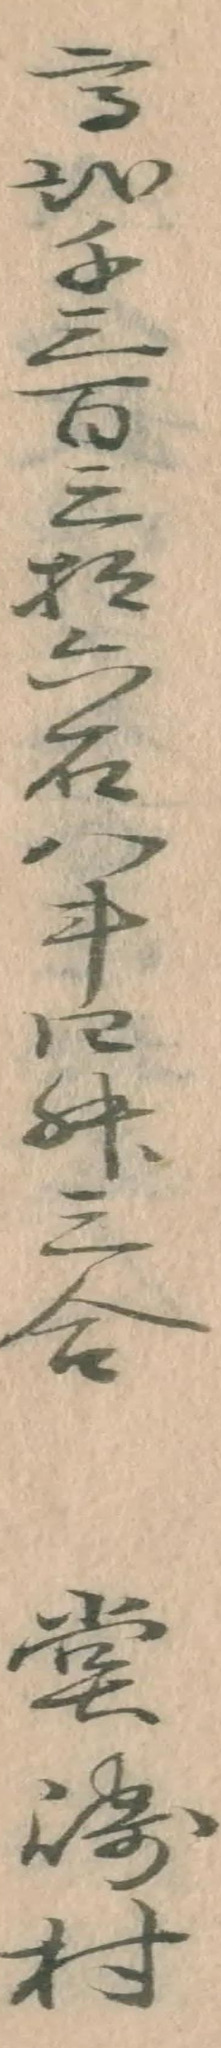高弐千三百三拾六石八斗四升三合堂崎村
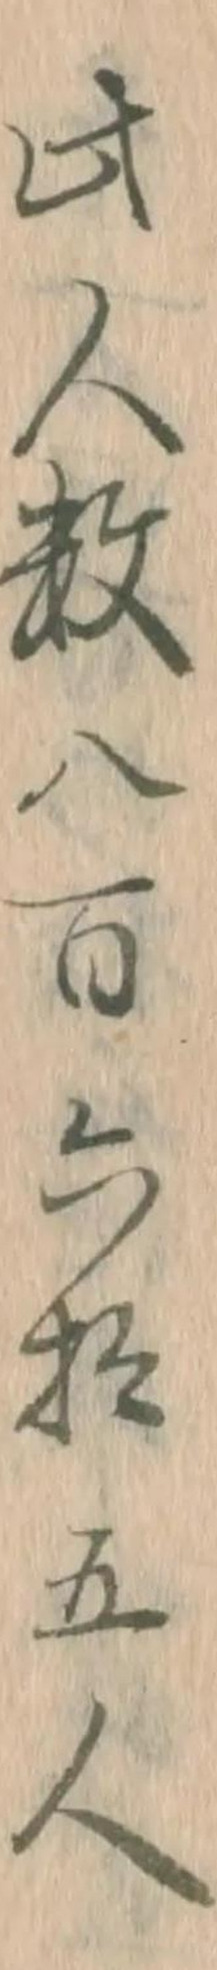此人数八百六拾五人
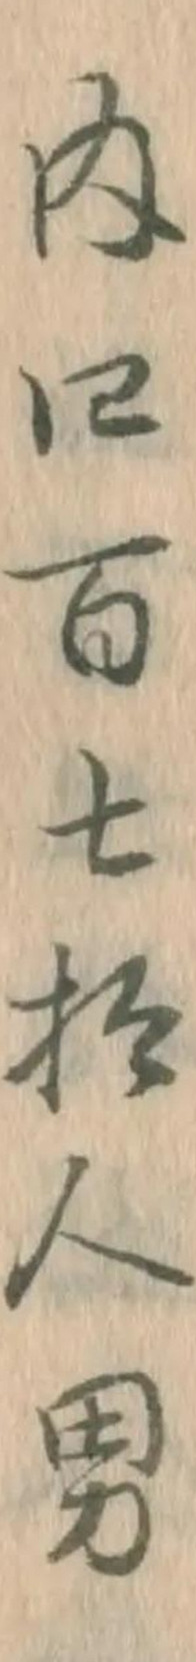内四百七拾人男

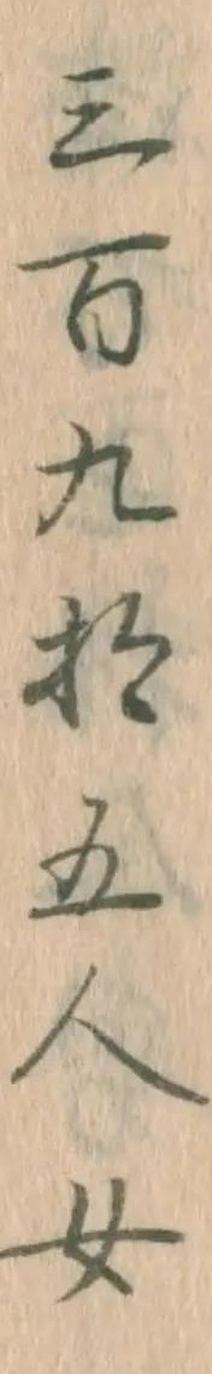三百九拾五人女
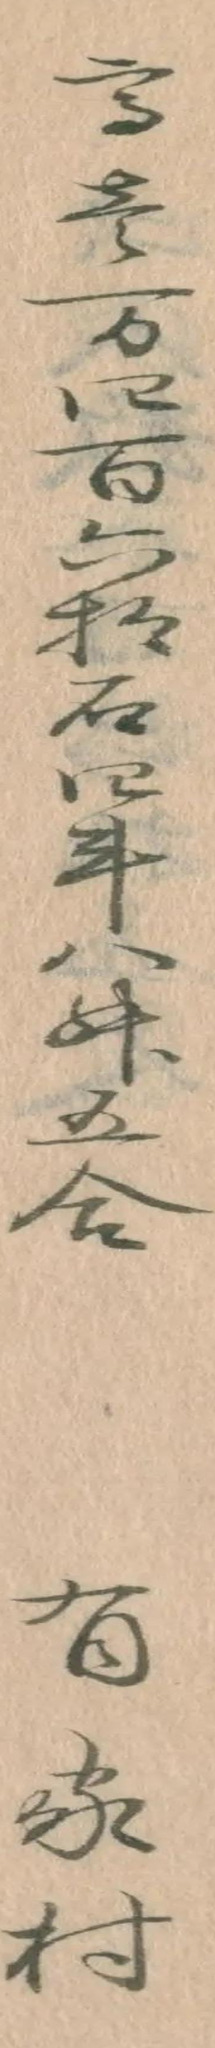高壱万四百六拾石四斗八升五合有家村
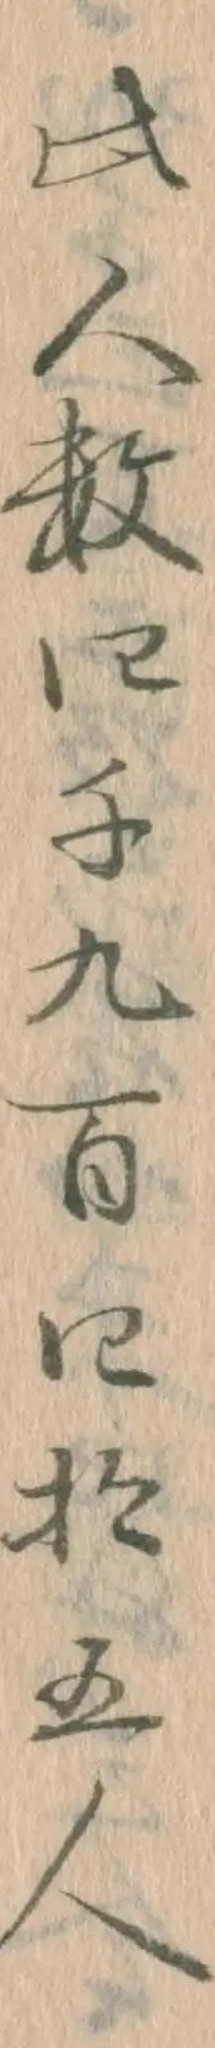此人数四千九百四拾五人
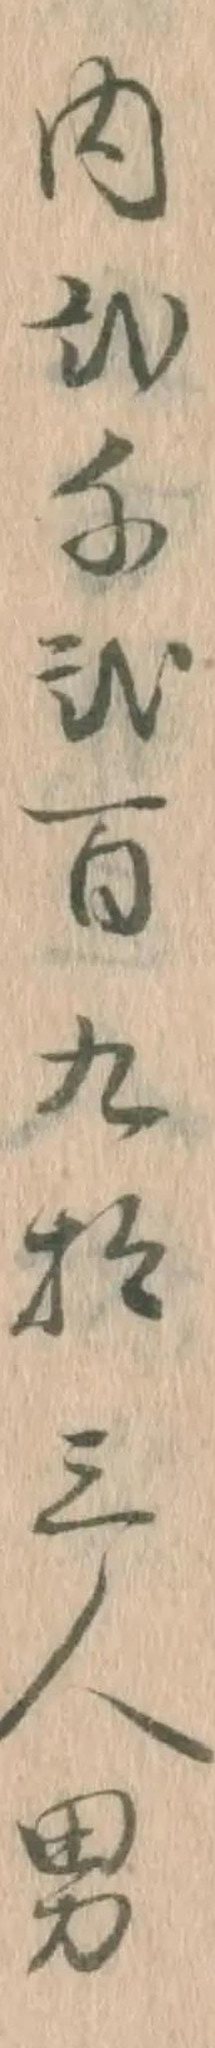内弐千弐百九拾三人男
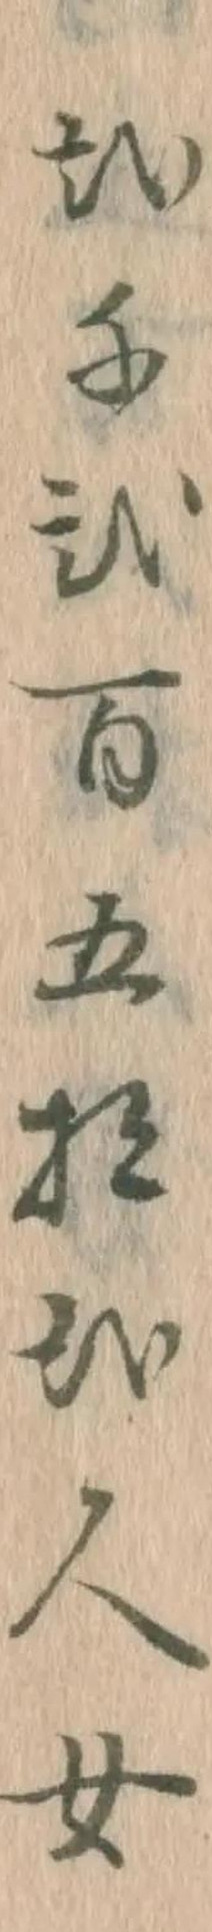弐千弐百五拾弐人女
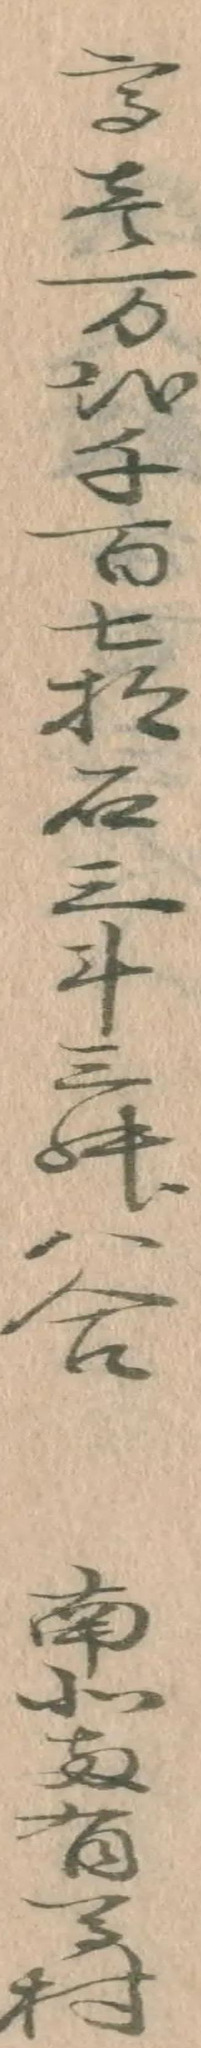高壱万弐千百七拾石三斗三升八合南北両有馬村
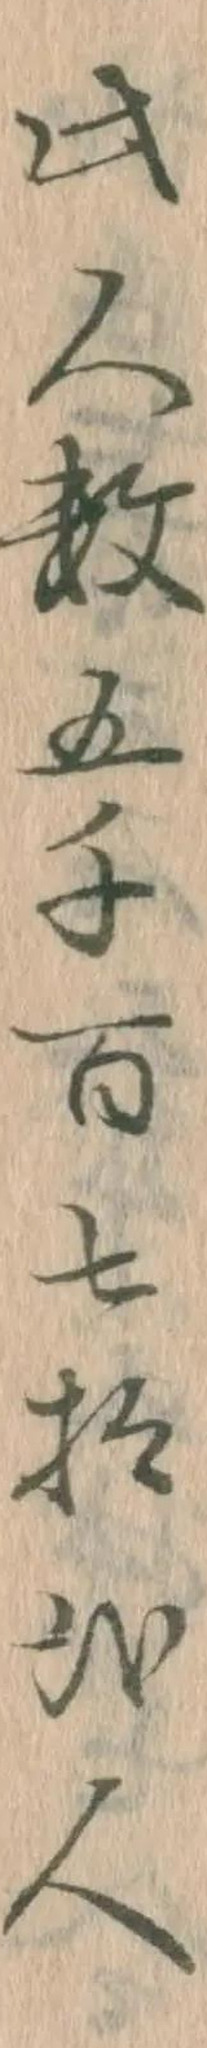此人数五千百七拾弐人
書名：切支丹御退治記 49巻. [2]
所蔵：国立国会図書館 National Diet Library, JAPAN
